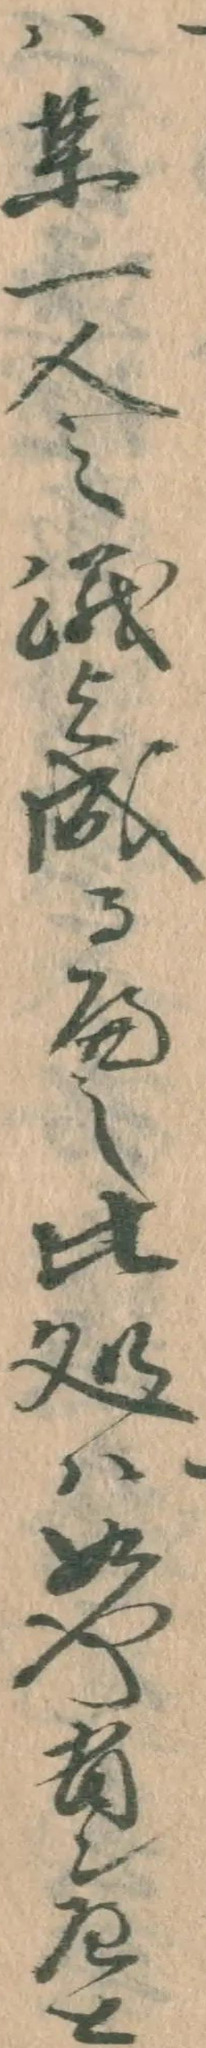は某一人之儀与成る扁し此処は如何有し扁と
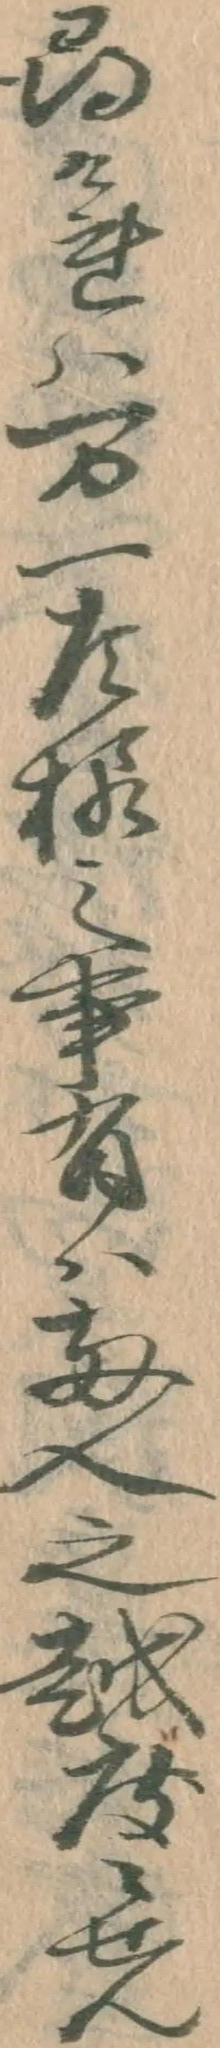尋け連は万一左様之事有は両人之越度にせん
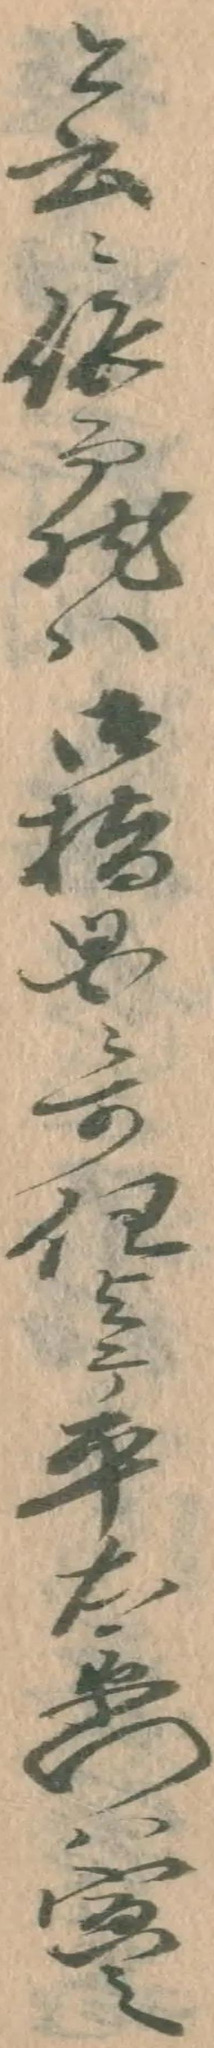と云に依而然は御指図に可任与て平右衛門は寅之
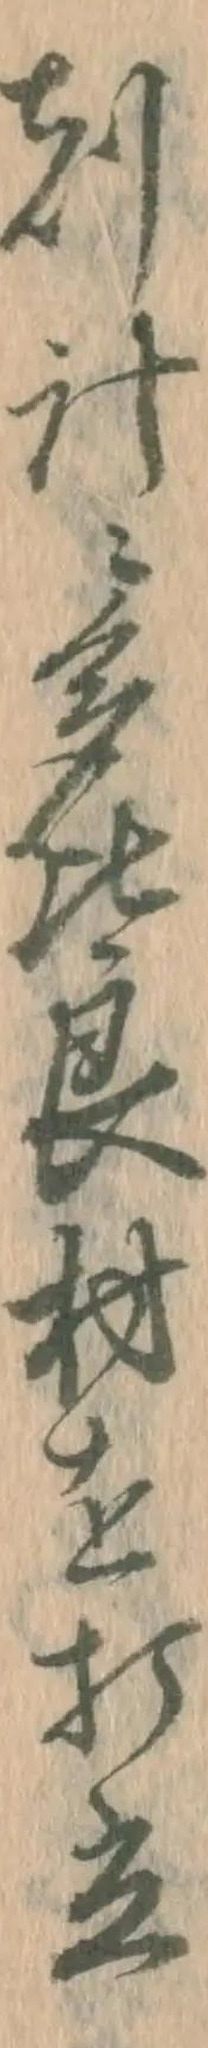刻計に多比良村を打立
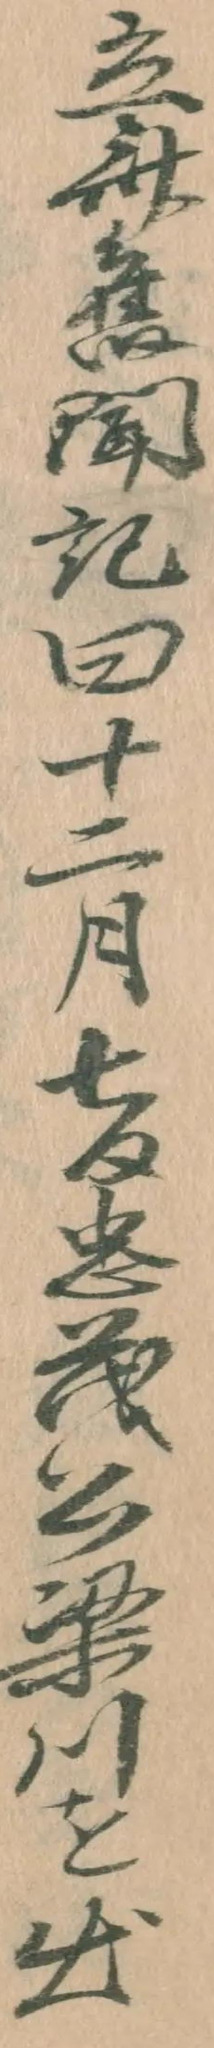立斎舊聞記曰十二月七日忠茂公梁川を出
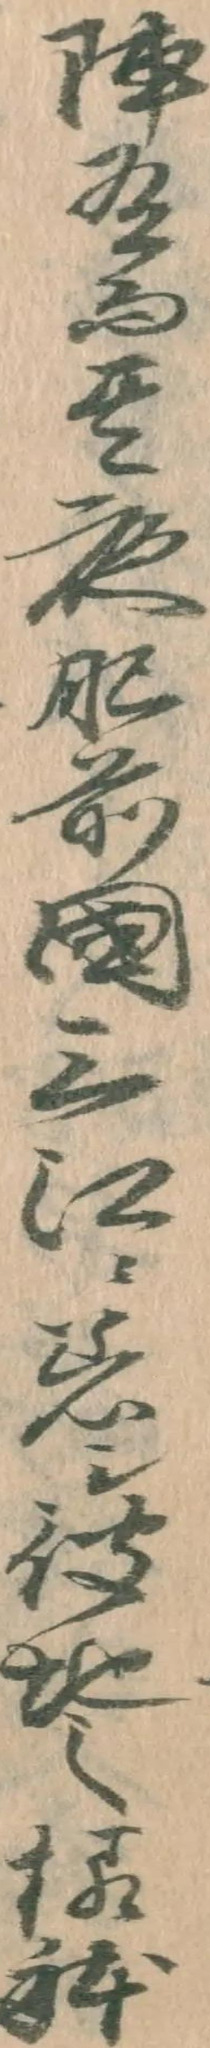陣有而其夜肥前国三江に着し彼地之様躰
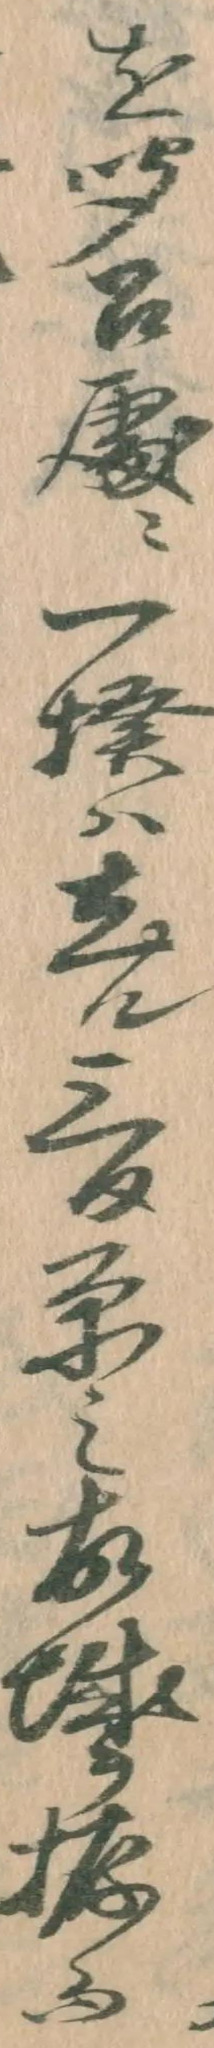を聞召處に一揆は去る三日原之古城を拵而
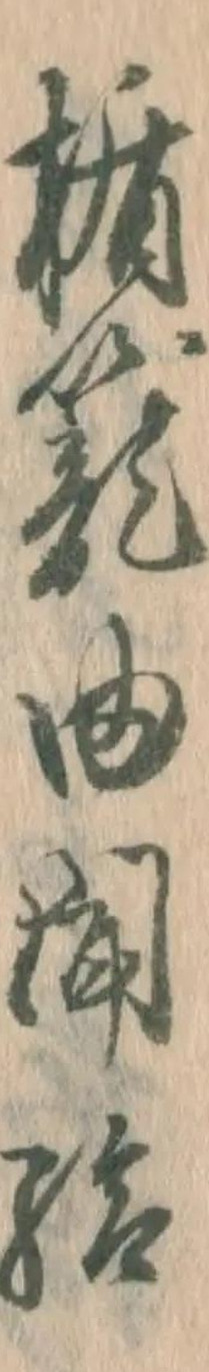楯籠由聞給
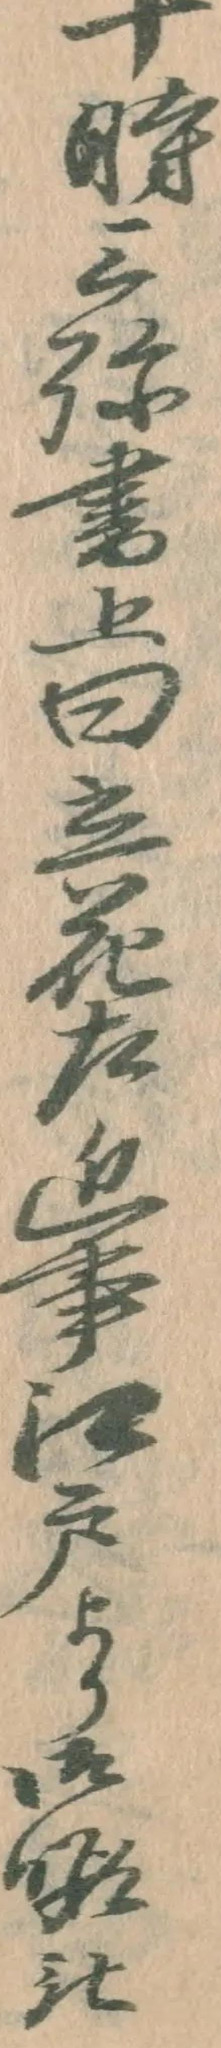十時三弥書上曰立花左近事江戸より御暇被
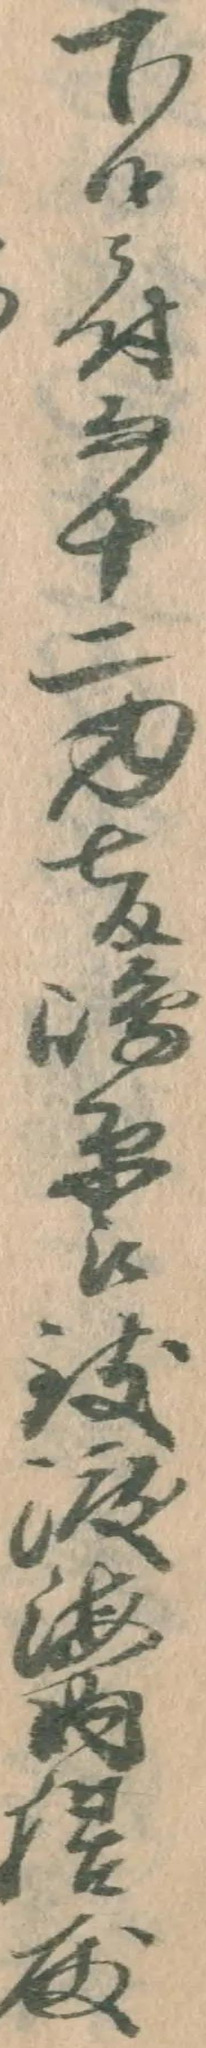下候に付而十二月七日島原江致渡海内膳殿
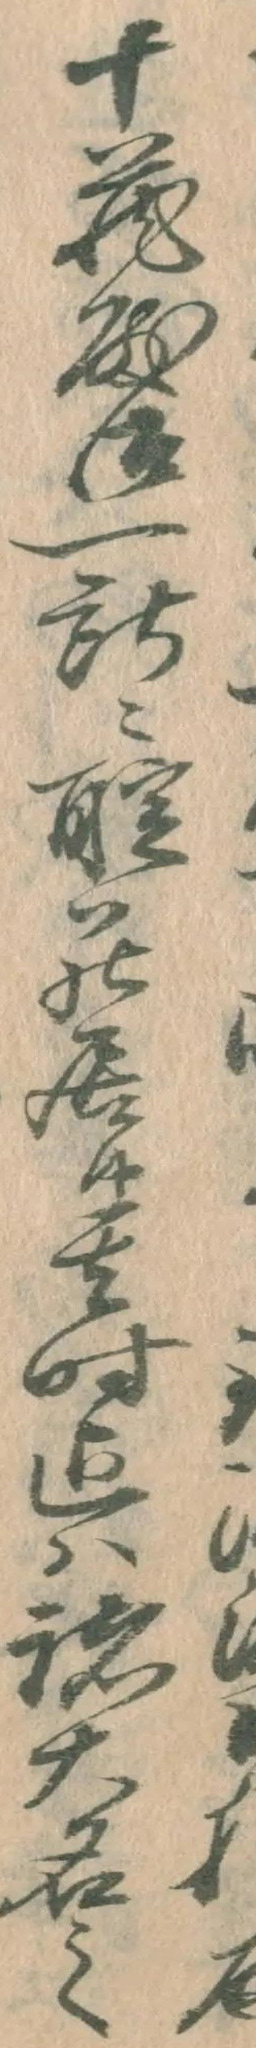十蔵殿御一所に聢罷居候其時迄は諸大名之
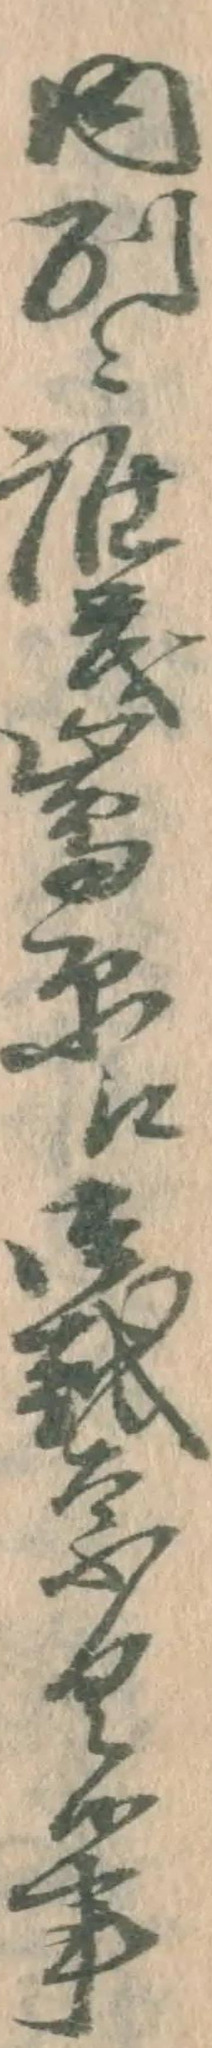内別に誰茂島原江御越奈里候事
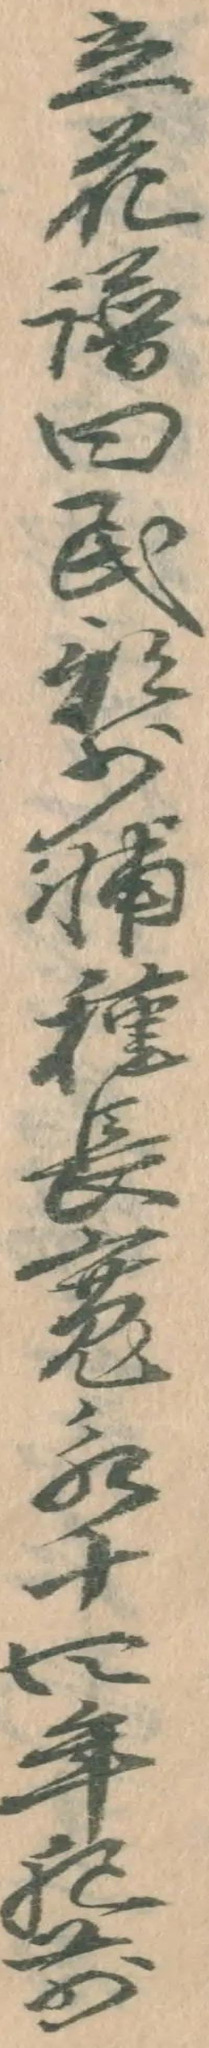立花譜曰民部少輔種長寛永十四年肥前
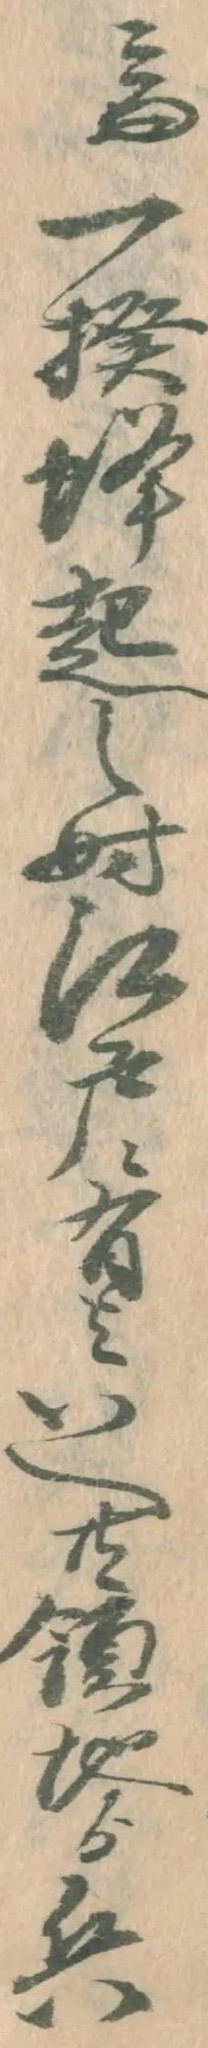に而一揆蜂起之時江戸に有与いへ共領地ゟ兵

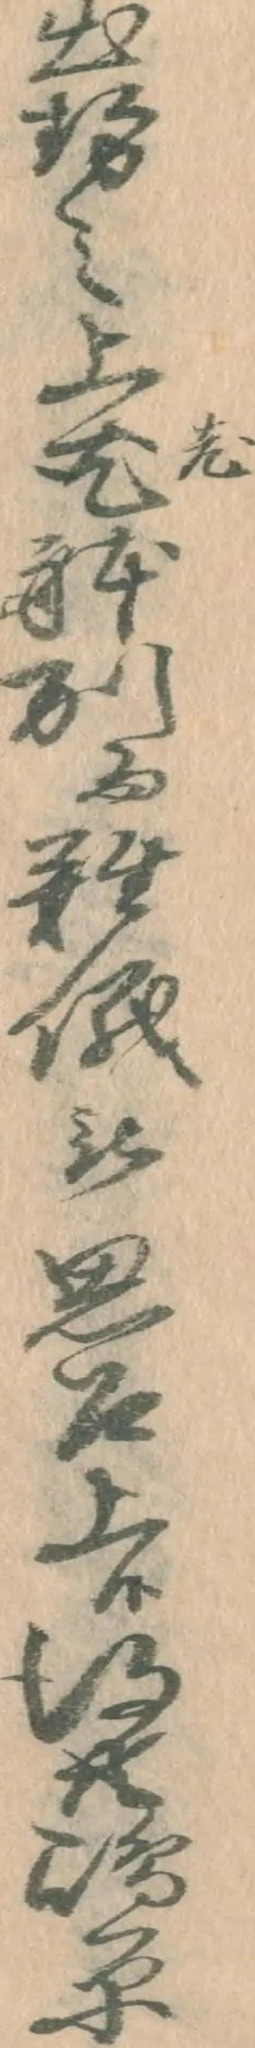出勢之上老躰別而難儀被思召上候得共島原
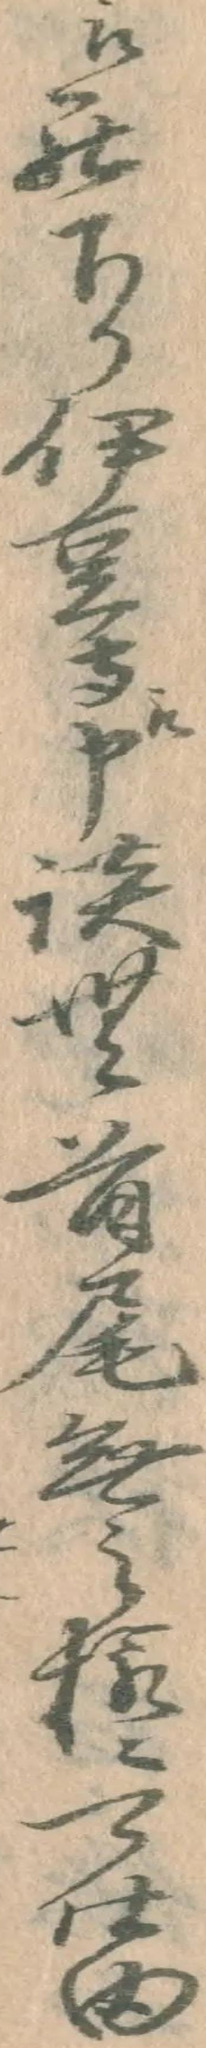江罷下り伊豆守江申談無首尾無之様に可仕由
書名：切支丹御退治記 49巻. [4]
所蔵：国立国会図書館 National Diet Library, JAPAN
